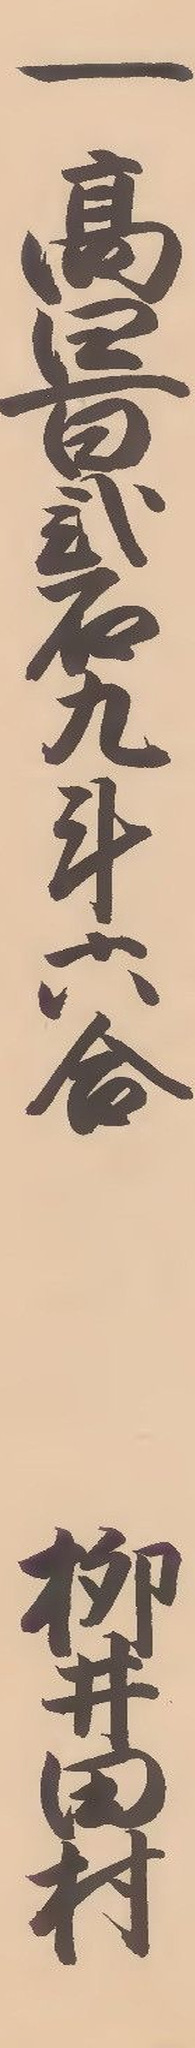一髙四百弐石九斗六合柳井田村

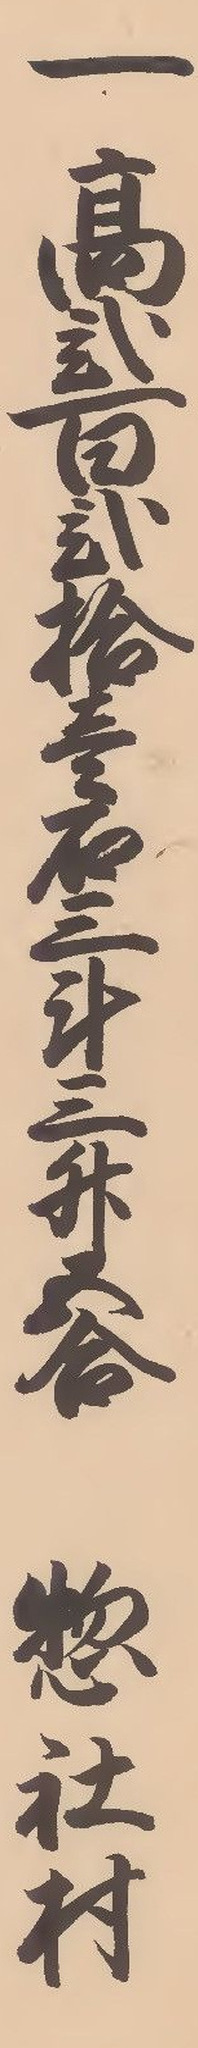一髙弐百弐拾壱石三斗三升五合惣社村
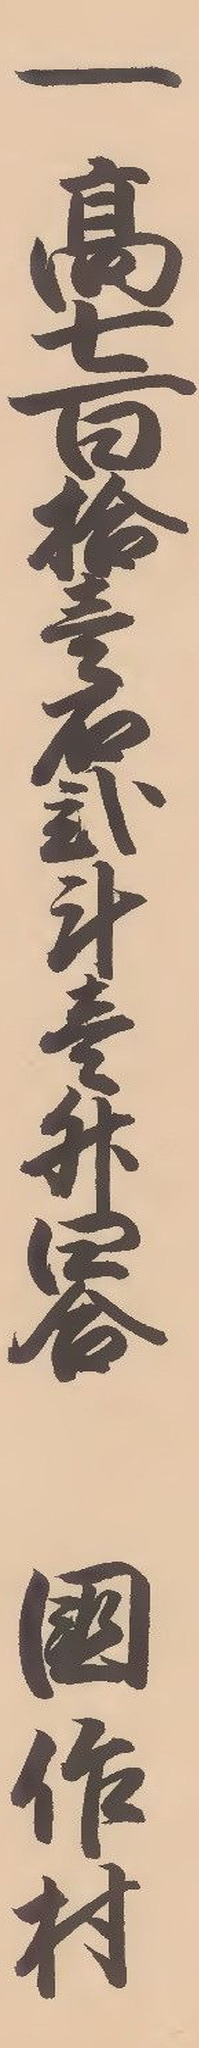一髙七百拾壱石弐斗壱升四合國作村
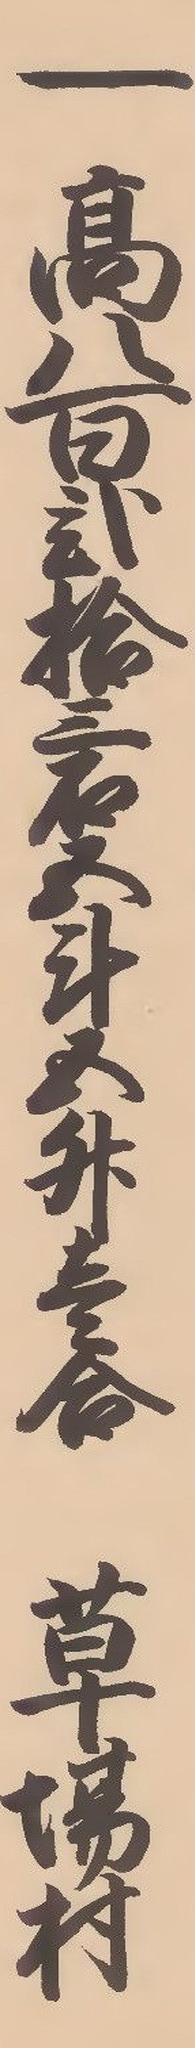一髙八百弐拾三石五斗五升壱合草場村
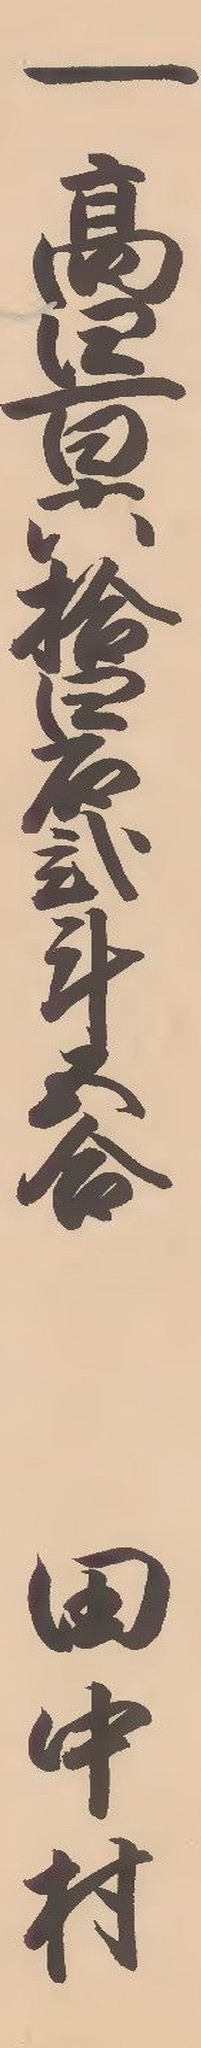一髙四百六拾四石弐斗五合田中村
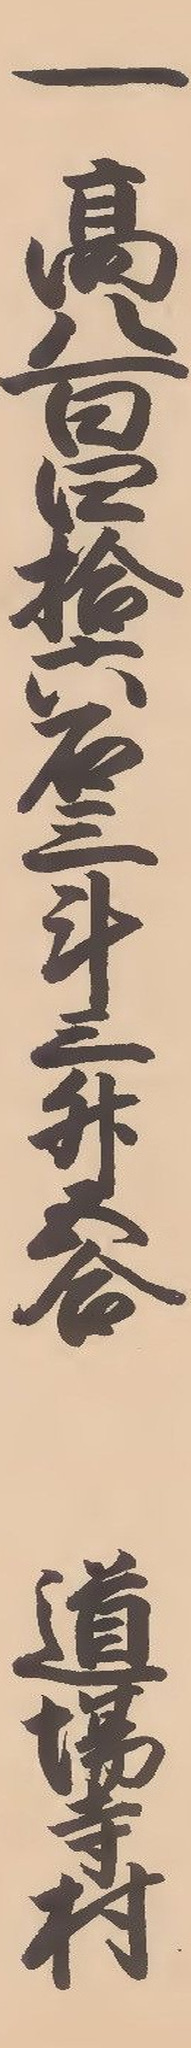一髙八百四拾六石三斗三升五合道場寺村
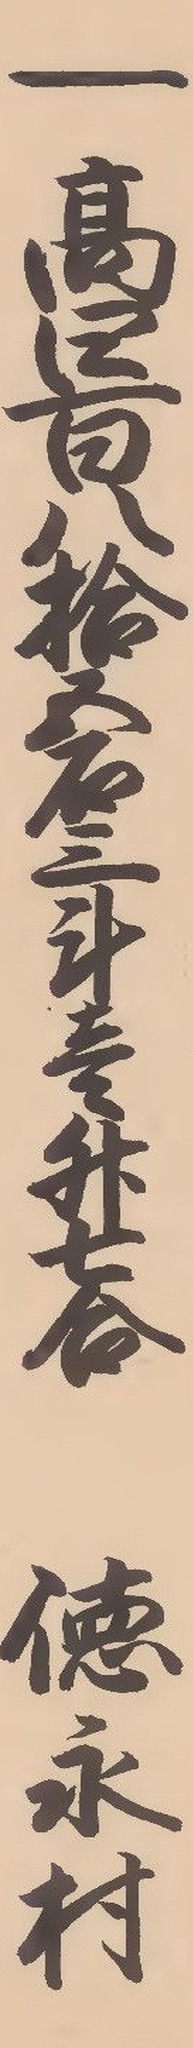一髙四百八拾五石三斗壱升七合徳永村
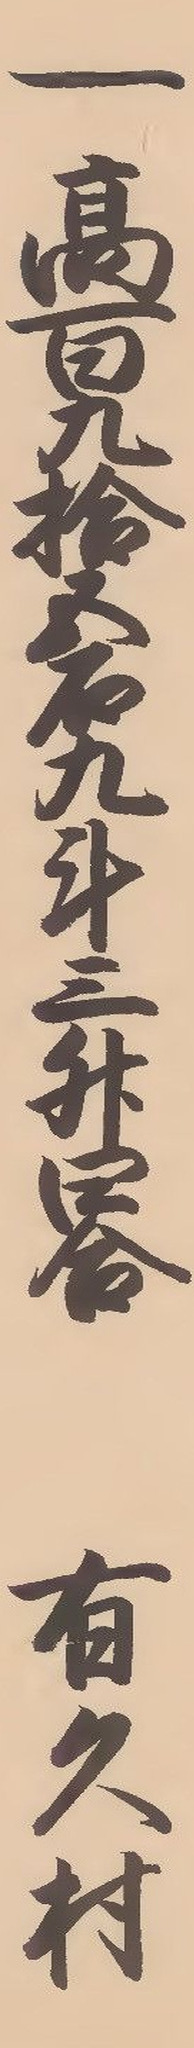一髙百九拾五石九斗三升四合有久村
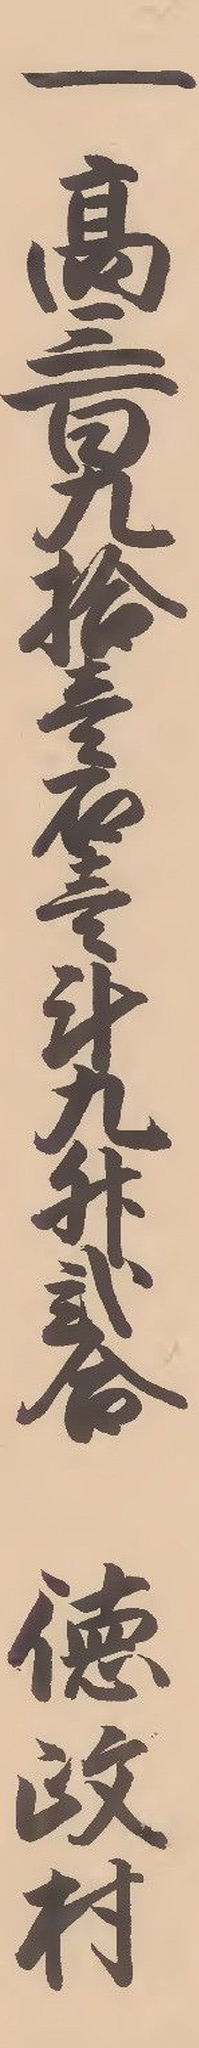一髙三百九拾壱石壱斗九升弐合徳政村

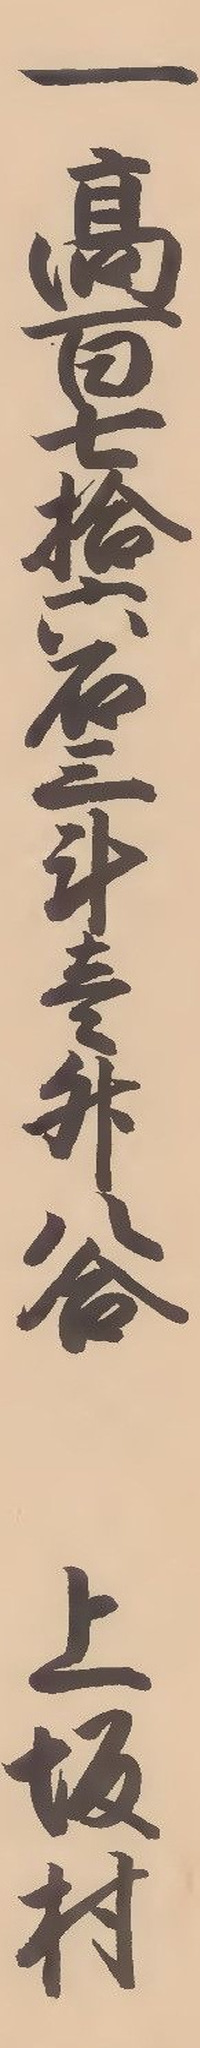一高百七拾六石三斗壱升八合上坂村
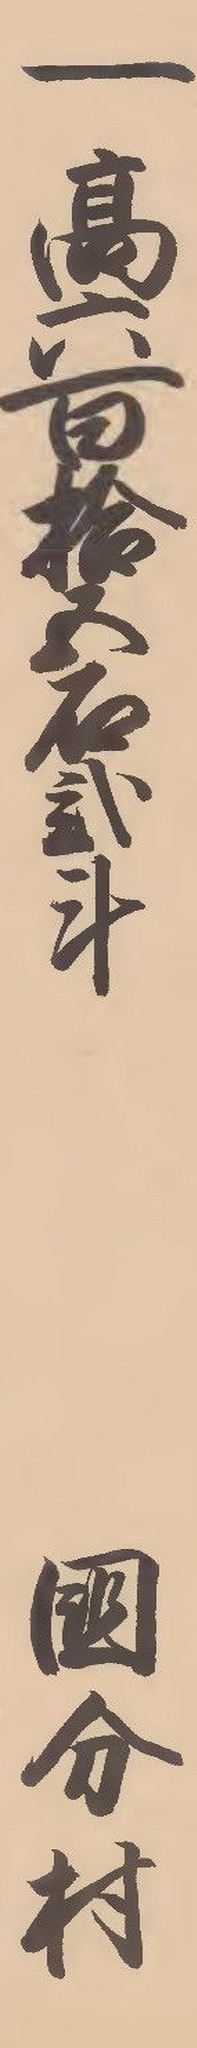一髙六百拾五石弐斗國分村
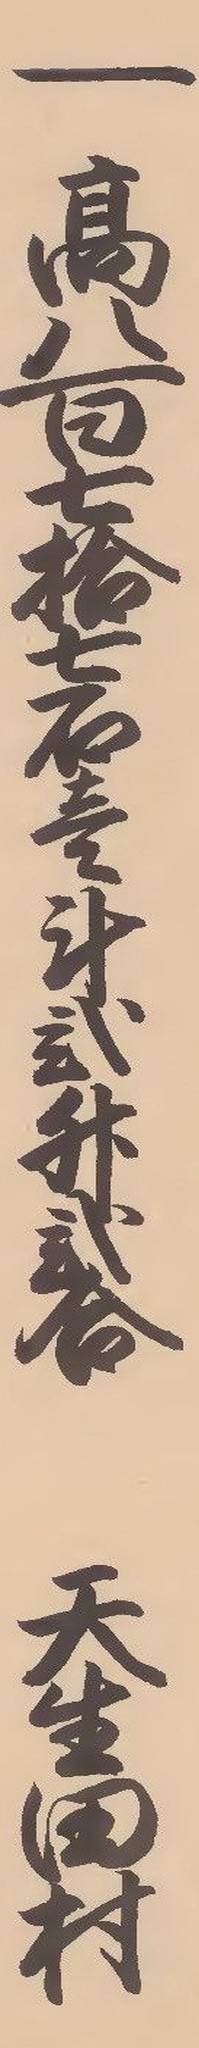一髙八百七拾七石壱斗弐升弐合天生田村
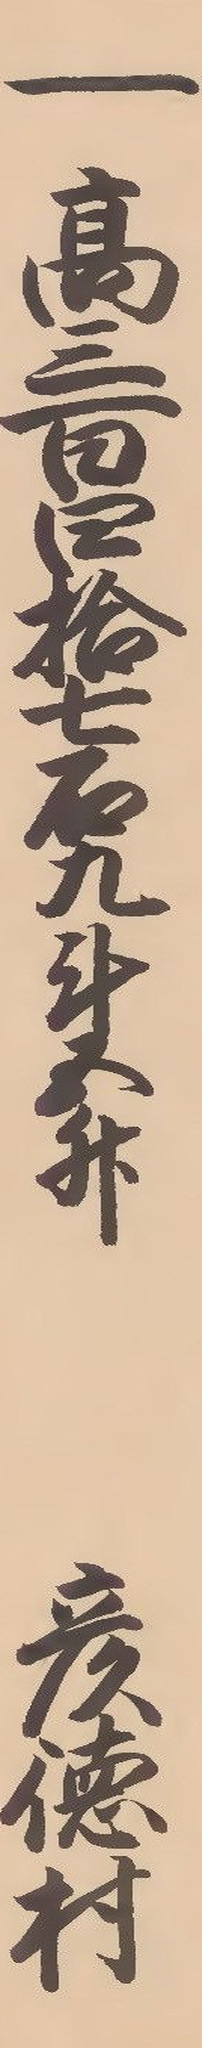一髙三百四拾七石九斗五升徳村
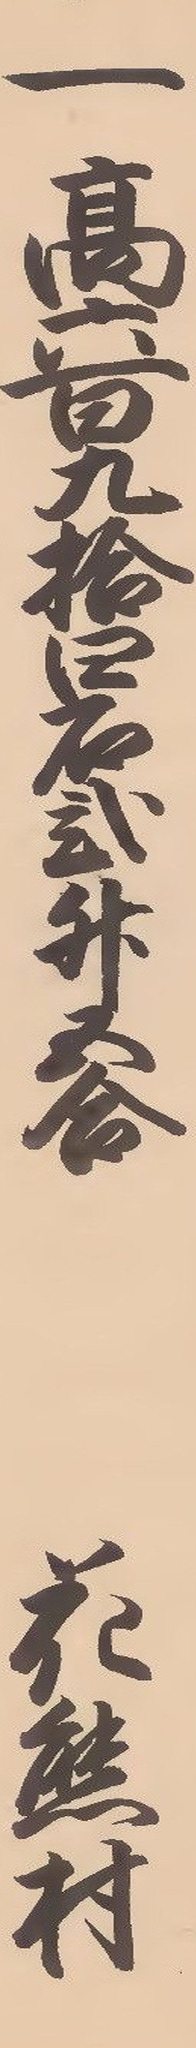一髙六百九拾四石弐升五合花熊村
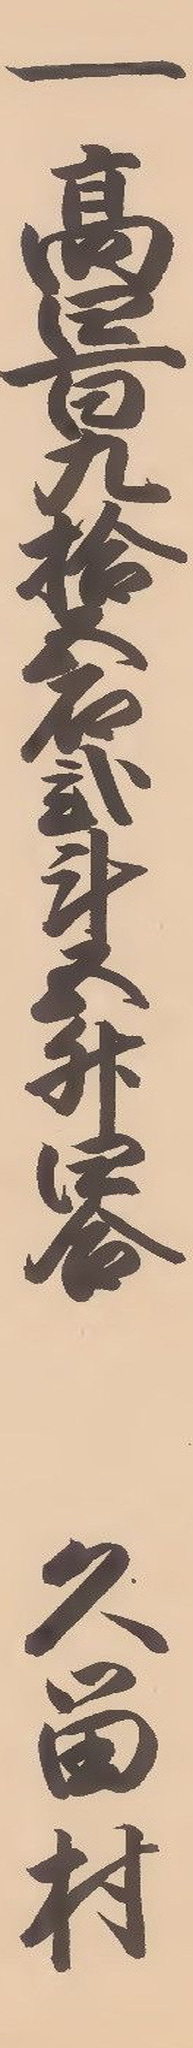一髙四百九拾五石弐斗五升四合久留村
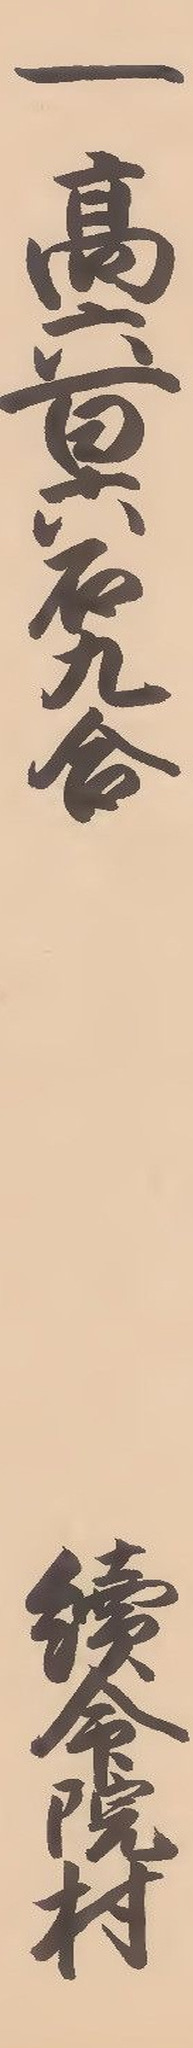一髙六百六石九合續命院村
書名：豊前国郷帳
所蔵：国立公文書館 National Archives of Japan
